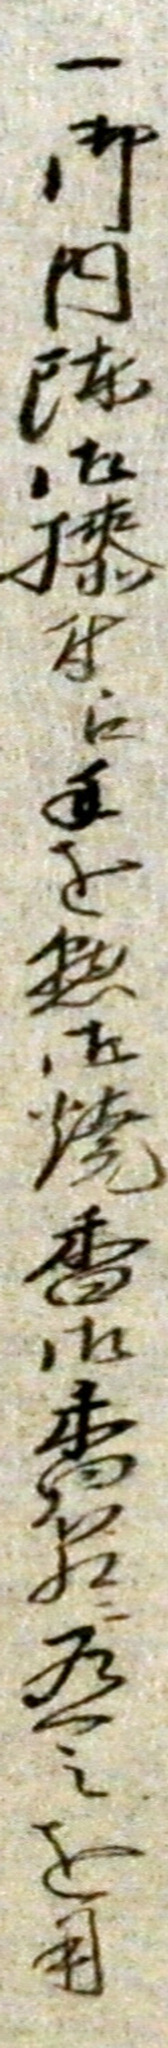一御内陣御膝付江手を懸御焼香御香箱有之を用
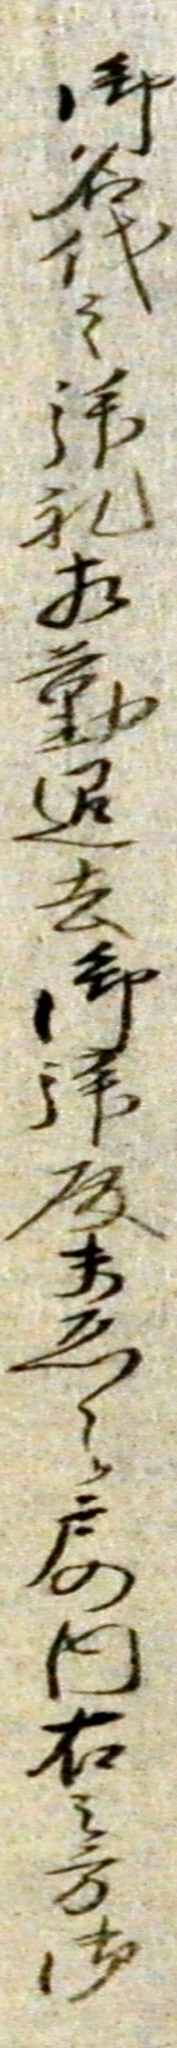御名代之拝礼相勤退去御拝殿まゑ之戸の内右之方御
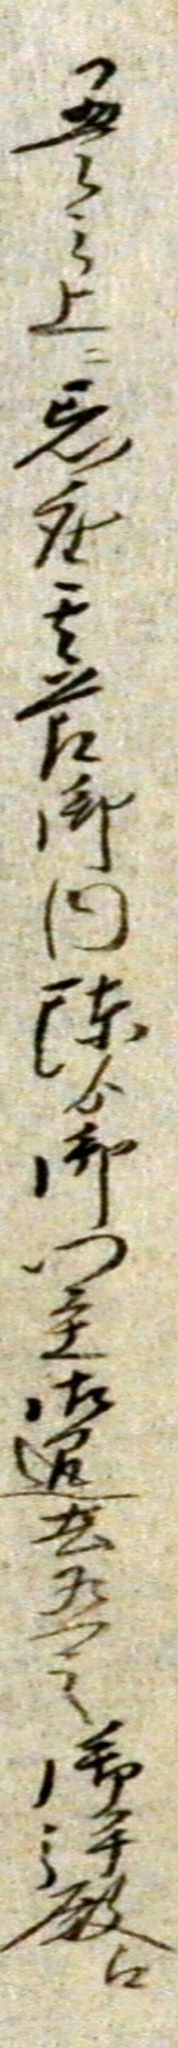畳之上ニ着座其御内陣ゟ御門主御退去有之御拝殿江
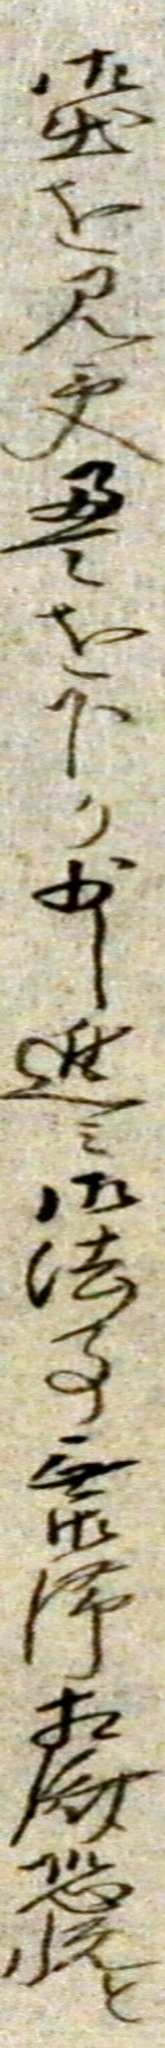御出を見受畳を下り少し進ミ御法事無御滞相済恐悦と
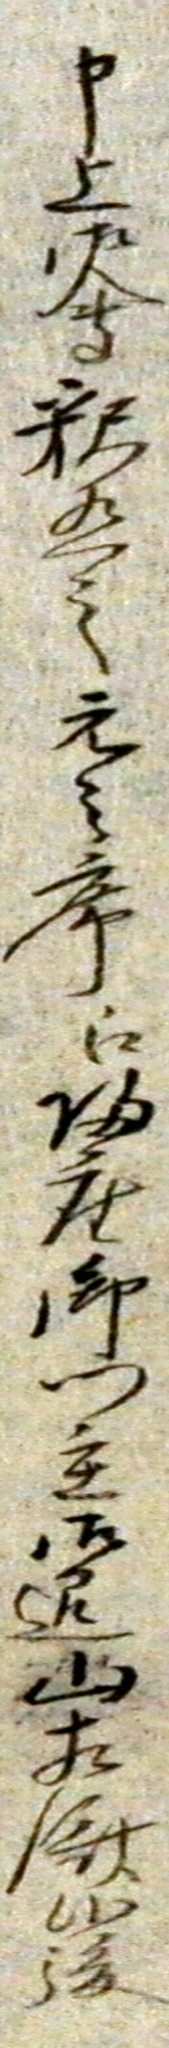申上御会釈有之元之席江帰座御門主御退山相済以後
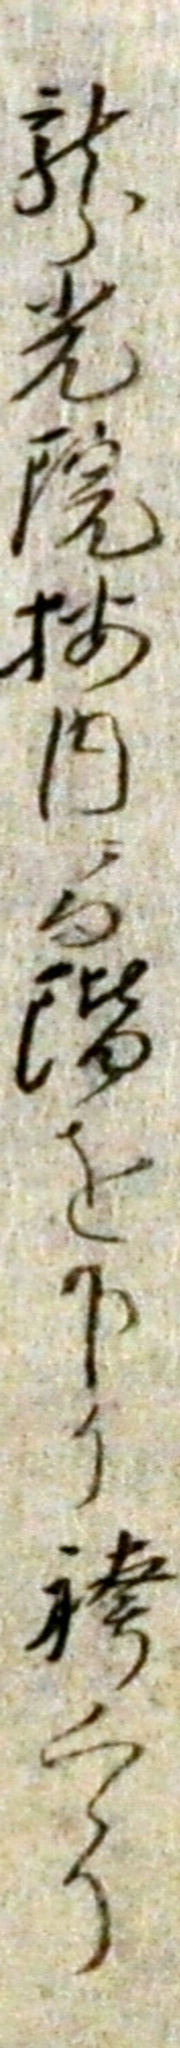龍光院案内ニ而階を下り袴くくり
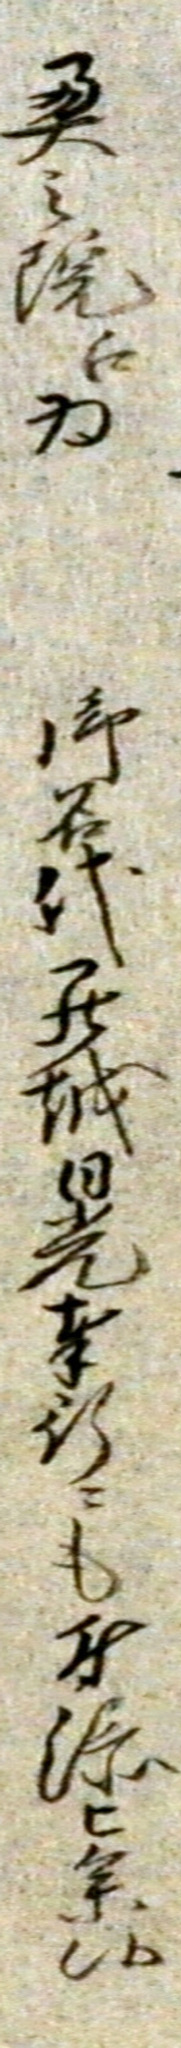奥之院江為御名代罷越日光奉行ニも付添ヒ参候
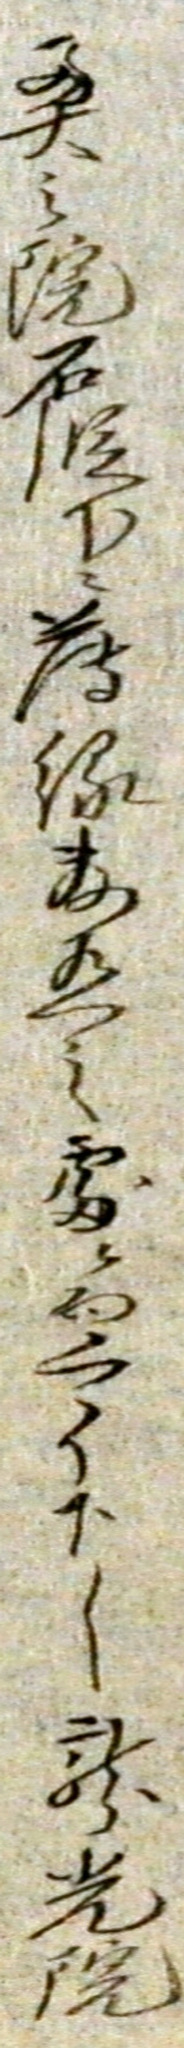奥之院石段下薄縁敷有之處ニ而くくり下候龍光院
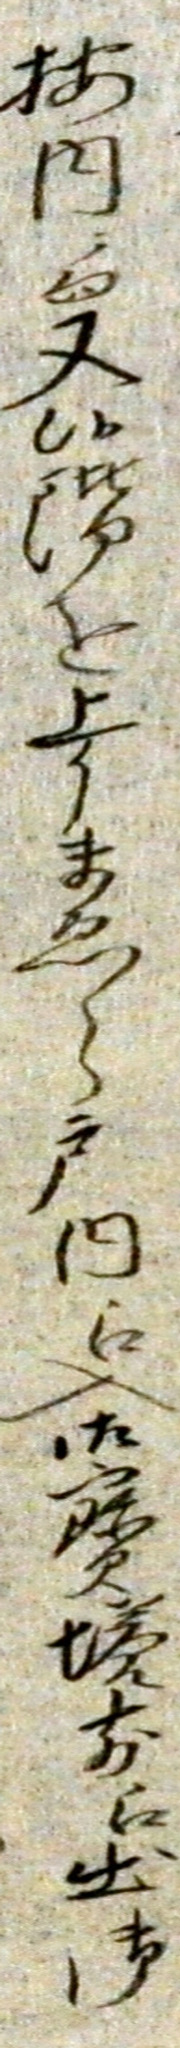案内ニ而又候階を上りまゑ之戸内江入御宝塔前江出御
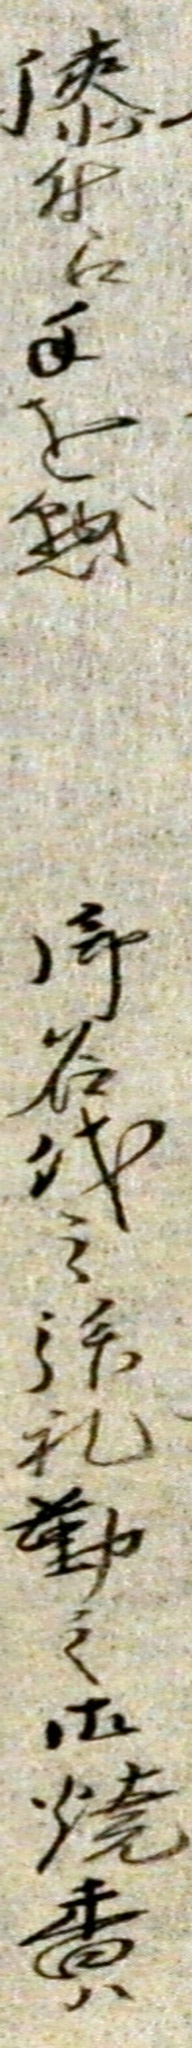膝付江手を懸御名代之拝礼勤之御焼香ㇵ
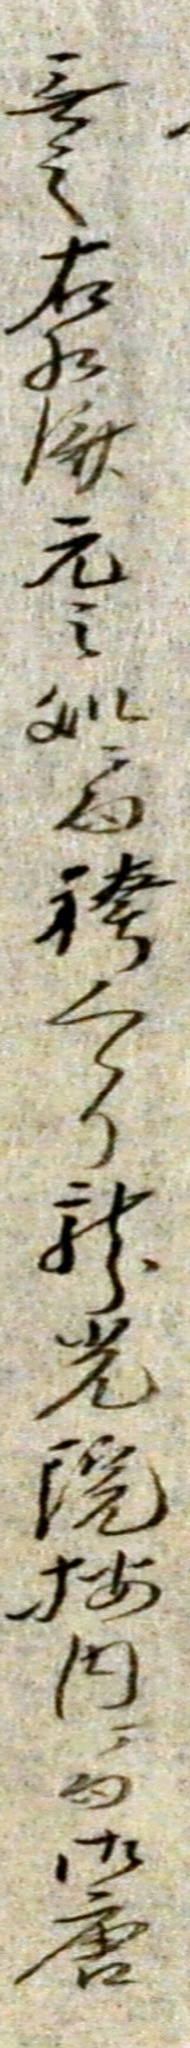無之右相済元処ニ而袴くくり龍光院按内ニ而御唐
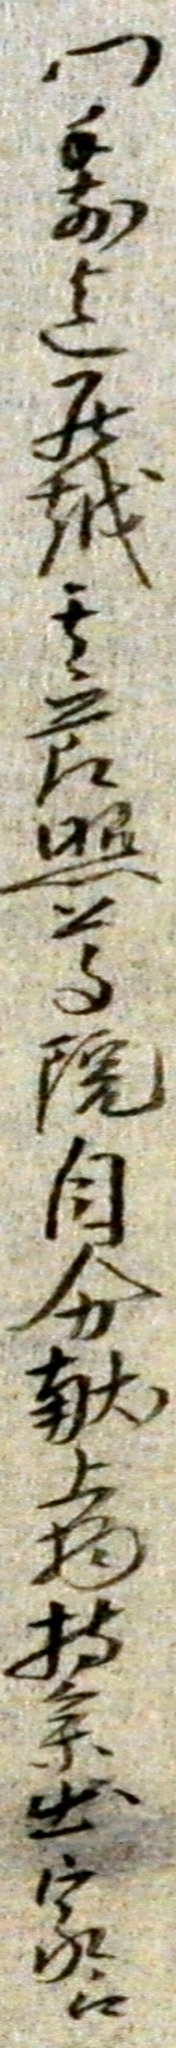門手前迄罷越其節照尊院自分献上物持参出家江
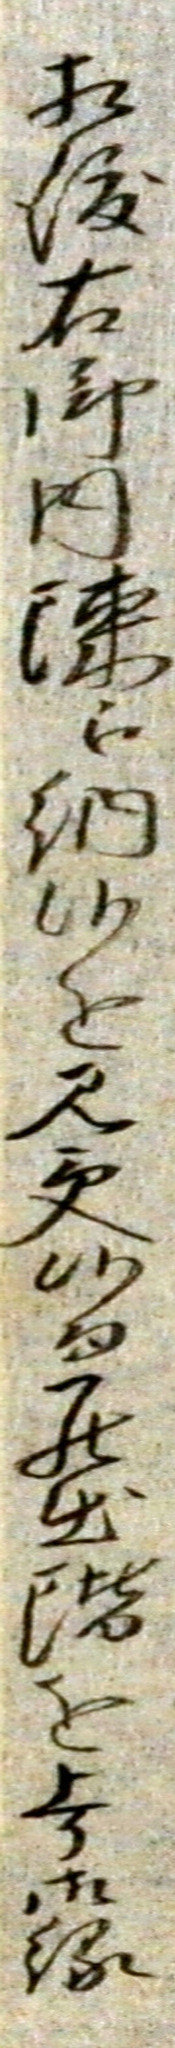相渡右御内陣江納候見受候而罷出階を上り御縁
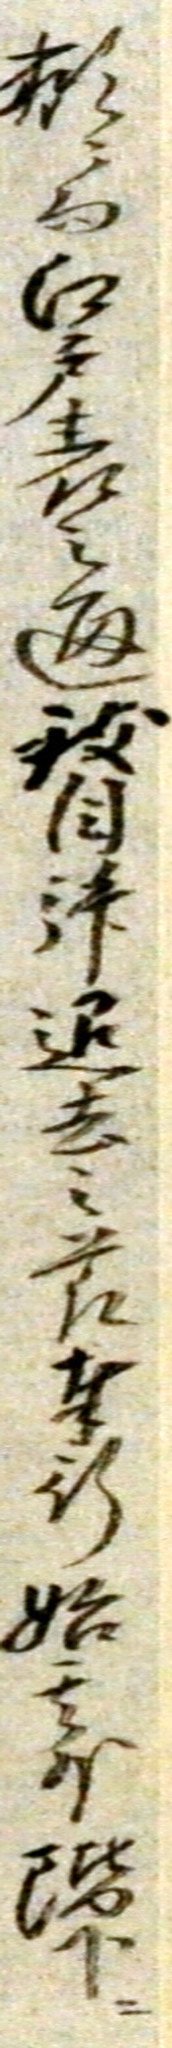頬ニ而江戸表之通致目拝退去之節奉行始其外階下二
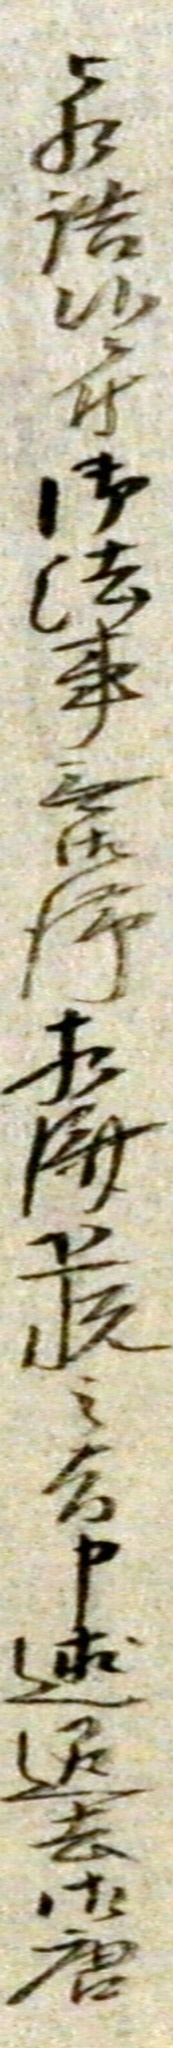ヒ相詰候ニ付御法事無御滞相済上悦之旨申述退去御唐
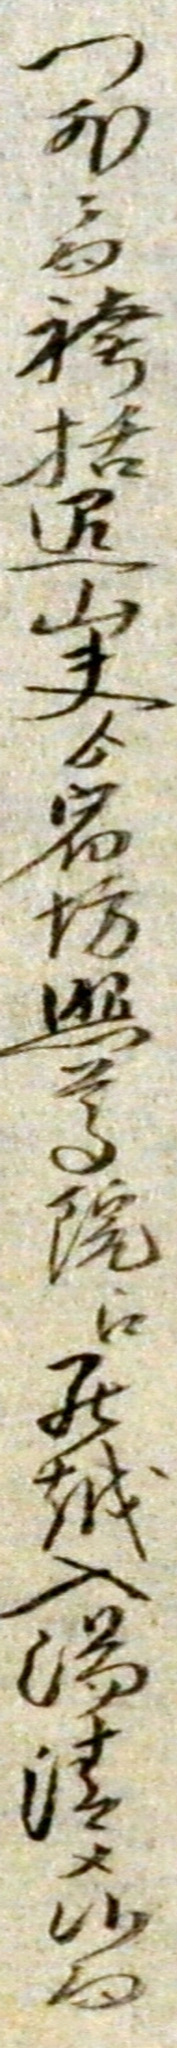門外ニ而袴退山夫ゟ宿坊照尊院江罷越入湯清メ候而
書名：日光御名代相勤候節ノ留
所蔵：伊那市立高遠町図書館・合同会社AMANE
